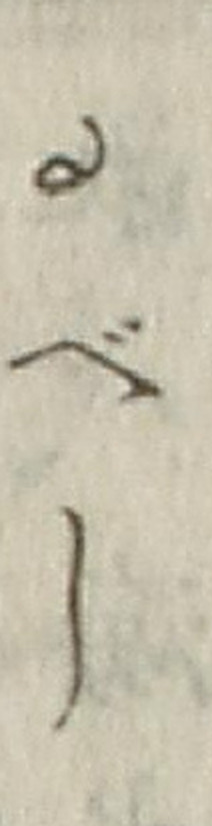るべし
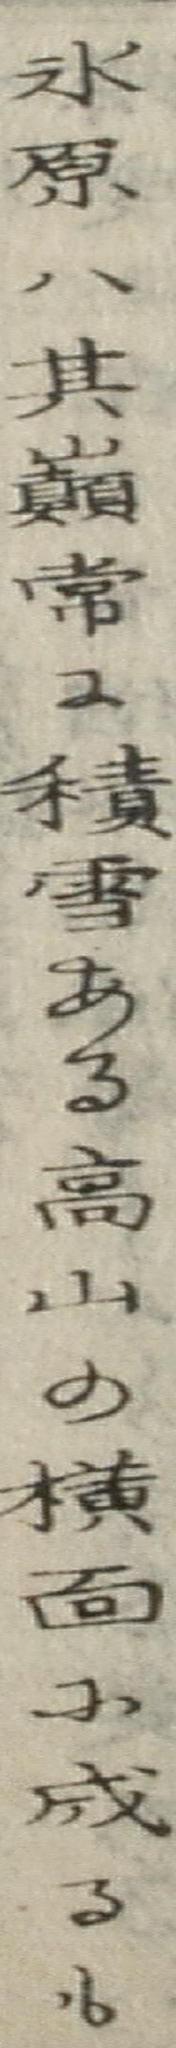氷原は其頂常に積雪ある高山の横面に成るも
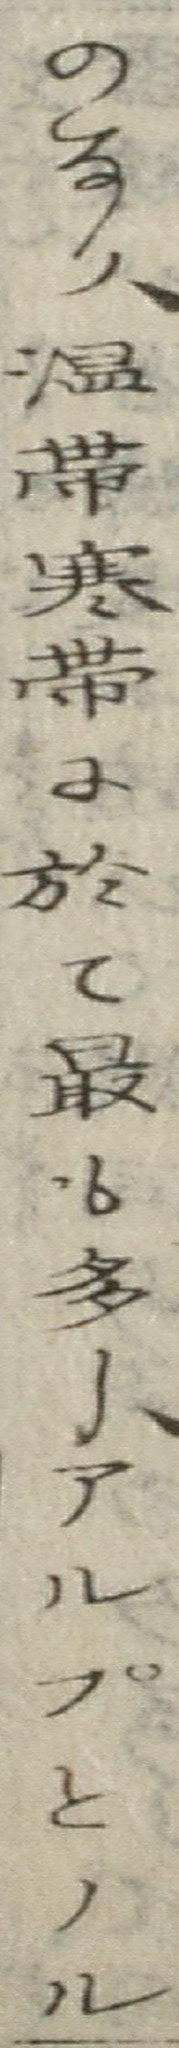のなり、温帯寒帯に於て最も多し、アルプとノル
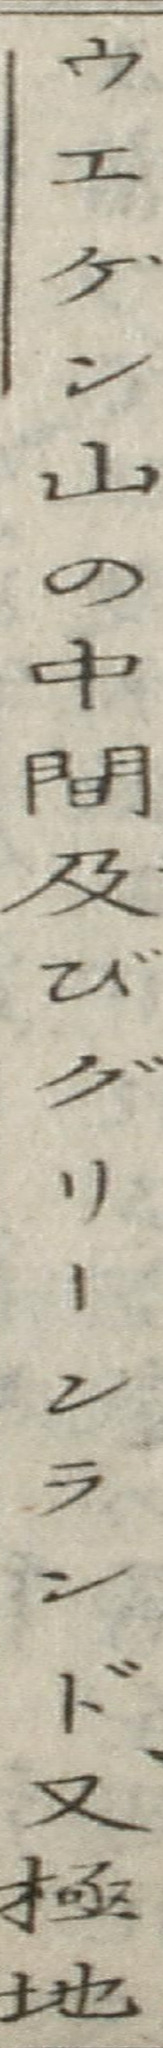ウエゲン山の中間、及びグリーンランド、又極地
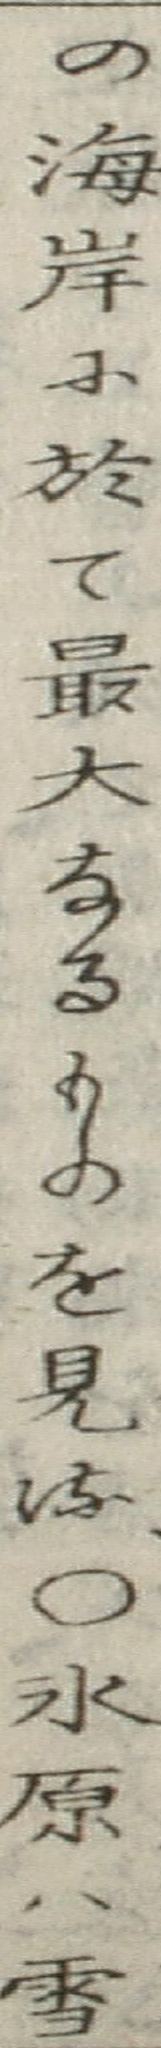の海岸に於て最大なるものを見る○氷原は雪
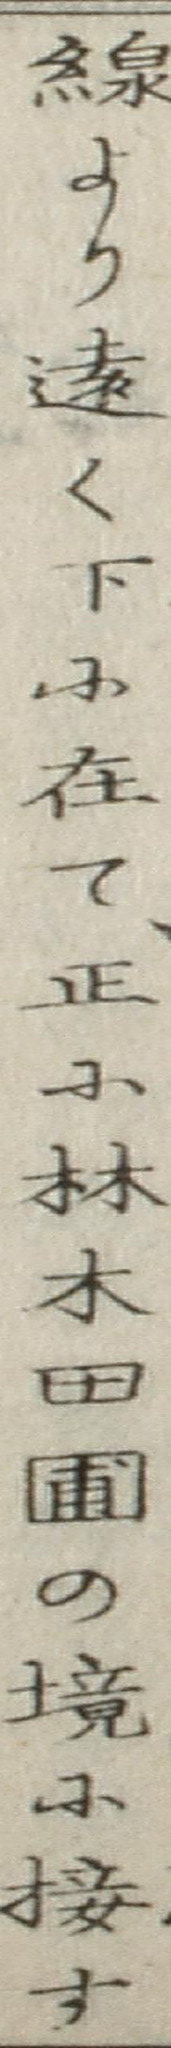線より遠く下に在て、正に林木田圃の境に接す
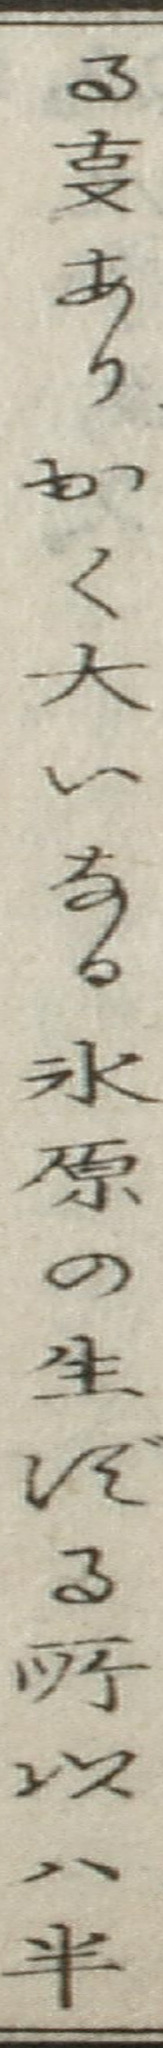る事あり、かく大いなる氷原の生ずる所以は、半
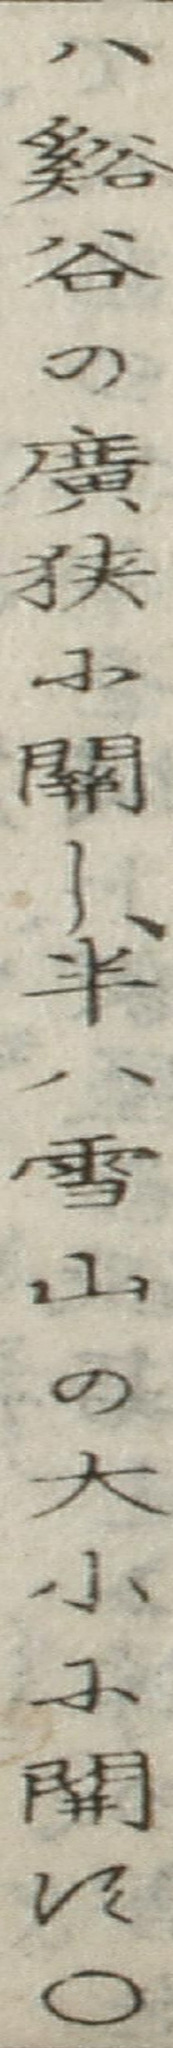は溪谷の広狭に関し、半は雪山の大小に関す、○
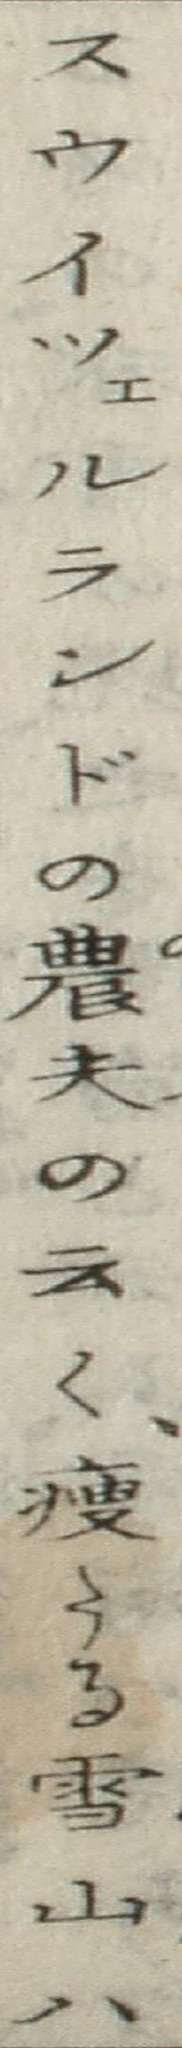スウイツェルランドの農夫の云く、痩たる雪山は
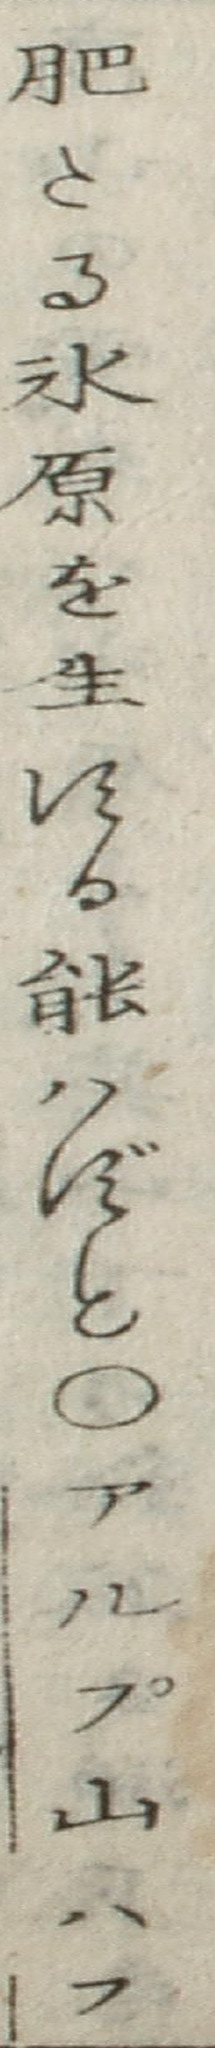肥たる氷原を生する能はずと○アルプ山ハフ
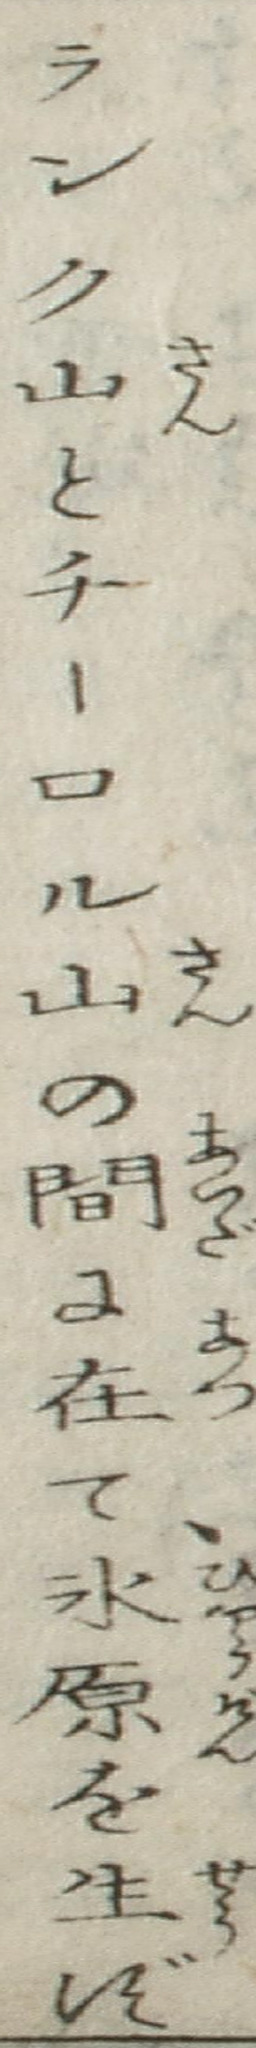ランク山とチーロル山の間に在て、氷原を生ず
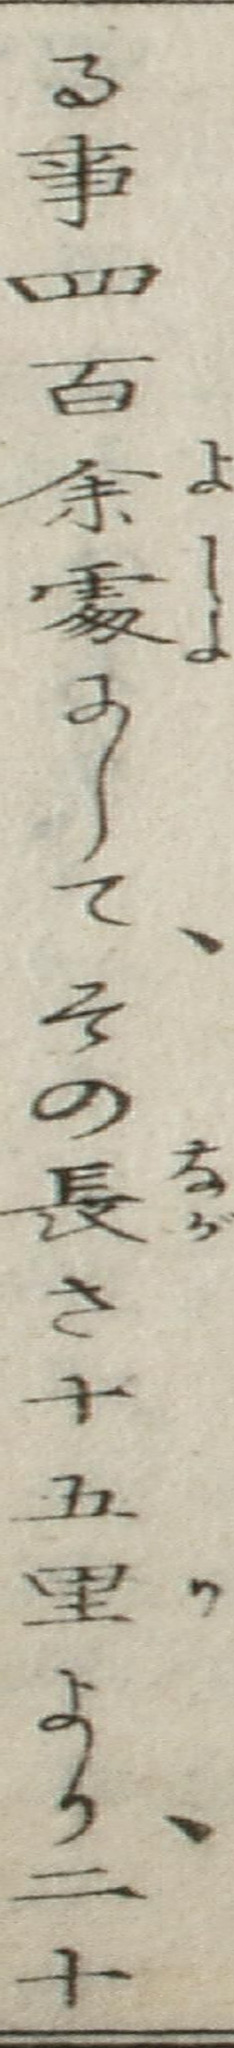る事四百余処にして、その長さ十五里より、二十

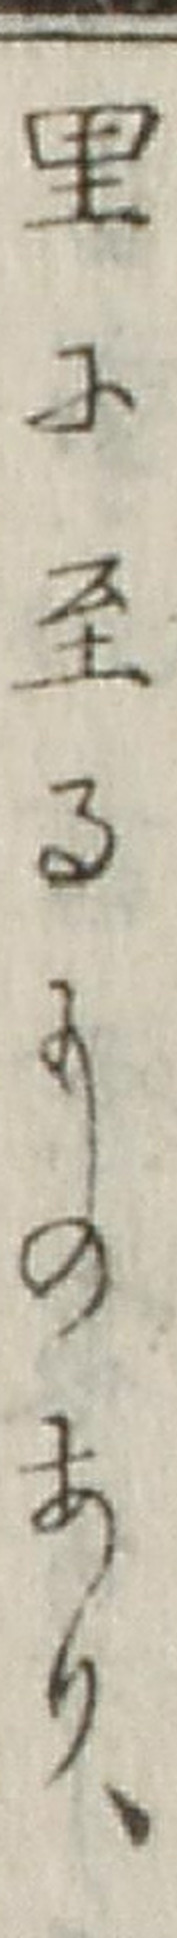里に至るものあり、
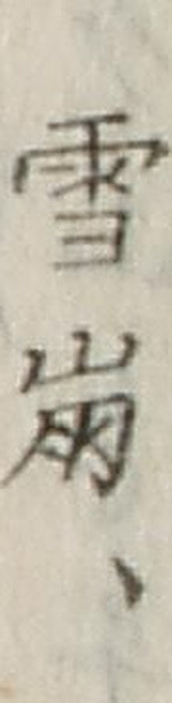雪崩、
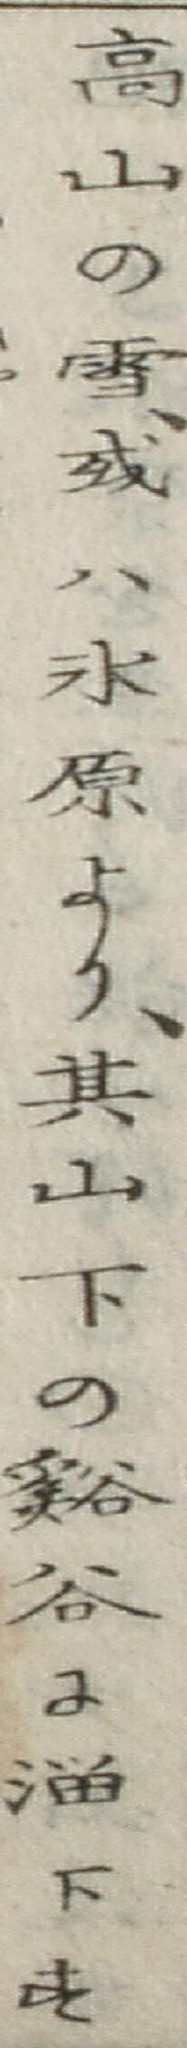高山の雪、或は氷原より、其山下の谿谷に溜下す
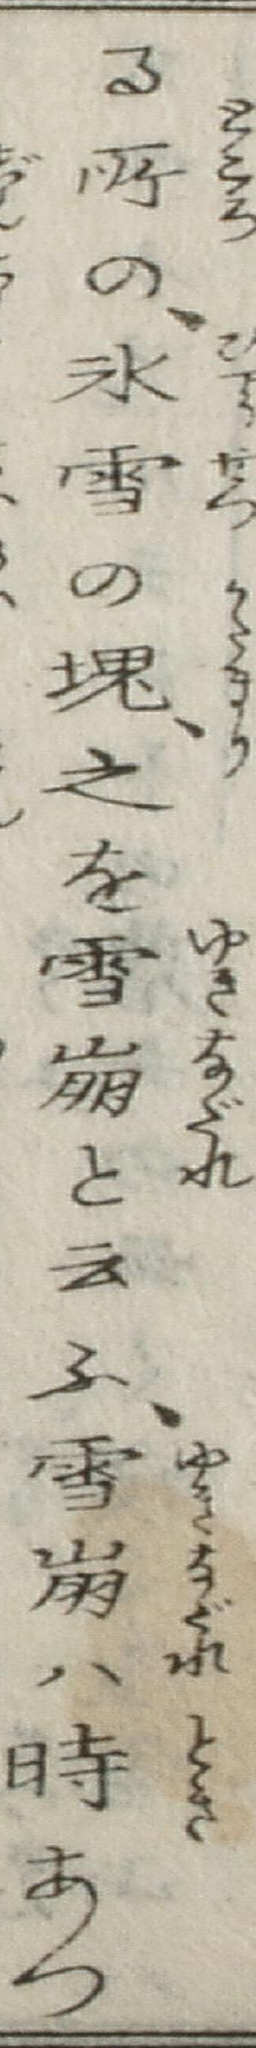る所の、氷雪の塊、之を雪崩と云ふ、雪崩は時あつ
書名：訓蒙　天然地理學　下
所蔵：東京大学地震研究所図書室 Earthquake Research Institute Library, The University of Tokyo, JAPAN
